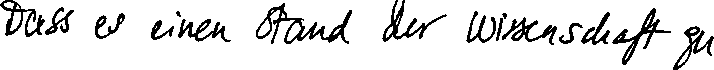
Dass es einen Stand der Wissenschaft zu
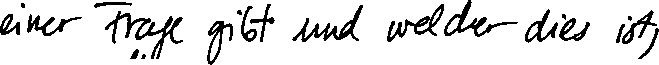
einer Frage gibt und welcher dies ist,
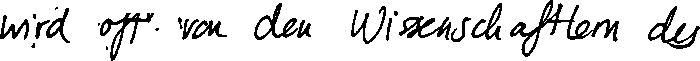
wird oft von den Wissenschaftlern des
